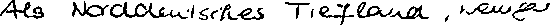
Als Norddeutsches Tiefland, weniger
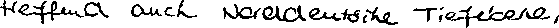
treffend auch Norddeutsche Tiefebene,
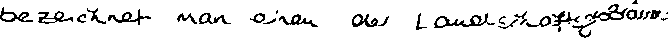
bezeichnet man einen der Landschaftsgroßräume
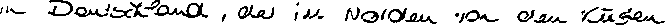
in Deutschland, der im Norden von den Küsten
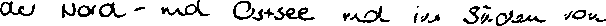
der Nord- und Ostsee und im Süden von
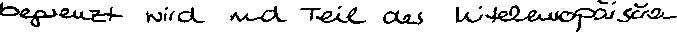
begrenzt wird und Teil des Mitteleuropäischen
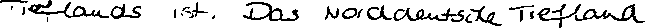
Tieflands ist. Das Norddeutsche Tiefland
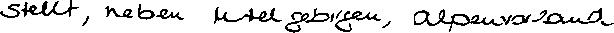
stellt, neben Mittelgebirgen, Alpenvorland
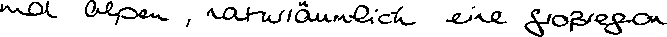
und Alpen, naturräumlich eine Großregion
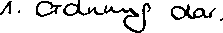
1. Ordnung dar.
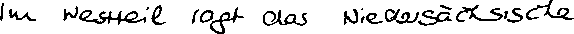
Im Westteil ragt das Niedersächsische
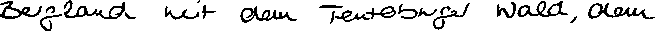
Bergland mit dem Teutoburger Wald, dem
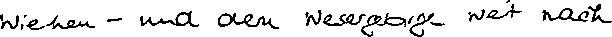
Wiehen- und dem Wesergebirge weit nach
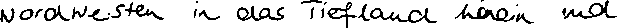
Nordwesten in das Tiefland hinein und
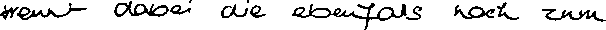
trennt dabei die ebenfalls noch zum
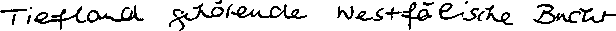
Tiefland gehörende Westfälische Bucht
